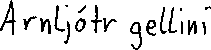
Arnljótr gellini
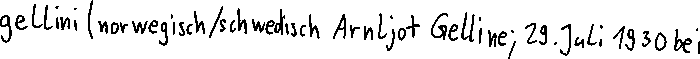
gellini (norwegisch/schwedisch Arnljot Gelline; 29. Juli 1930 bei
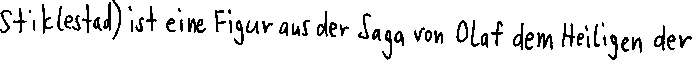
Stiklestad) ist eine Figur aus der Saga von Olaf dem Heiligen der
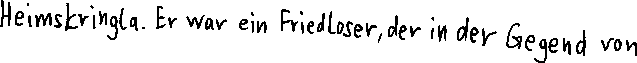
Heimskringla. Er war ein Friedloser, der in der Gegend von
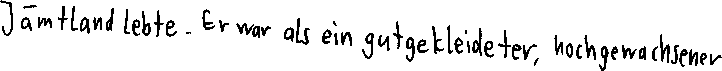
Jämtland lebte. Er wird als ein gutgekleideter, hochgewachsener
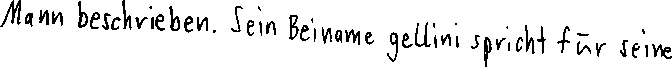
Mann beschrieben. Sein Beiname gellini spricht für seine
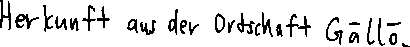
Herkunft aus der Ortschaft Gällö.
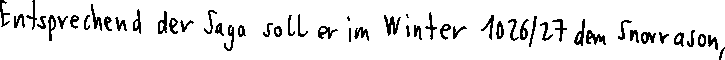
Entsprechend der Saga soll er im Winter 1026/1027 dem Snorrason,
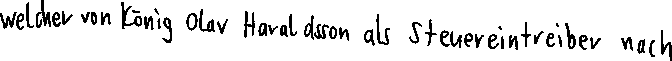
welcher von König Olav Haraldsson als Steuereintreiber nach
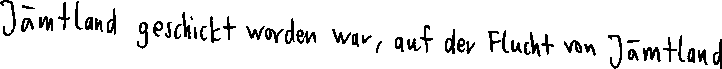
Jämtland geschickt worden war, auf der Flucht von Jämtland
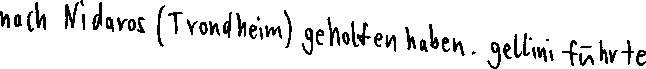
nach Nidaros (Trondheim) geholfen haben. gellini führte
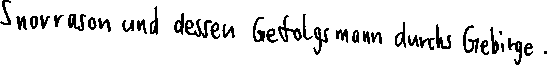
Snorrason und dessen Gefolgsmann durchs Gebirge.
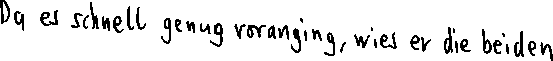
Da es nicht schnell genug voranging, wies er die beiden
